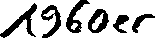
1960er
